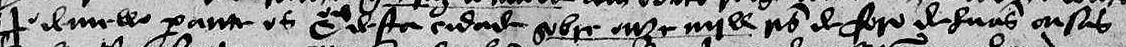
Jo de mello ꝑante os Cos desta cidade sobre onze mjll rrs̄ de foro de huas̄ casas
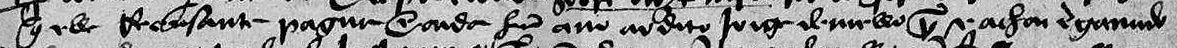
q̄ elle Recusante pagua ē cada hū ano ao dito Jorge de mello p̄o se achar ēganado
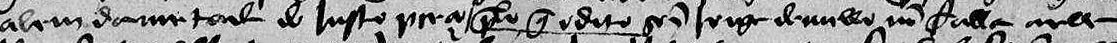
alem da metado do Justo preço p̄lo q̄ o dito sor̄ Jorge de mello nō falla a elle
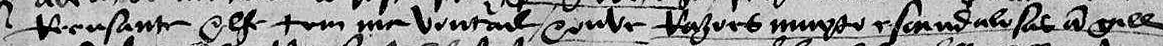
Recusante e lhe tem ma vontade / e ouve Razoes muyto escandalosas cō gill
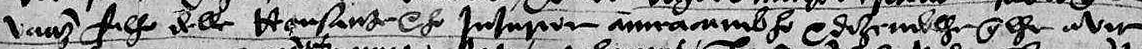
vaaz̄ filho delle Recusante e ho JnJuriou ameaçando ho e dizendolhe q̄ lhe avia
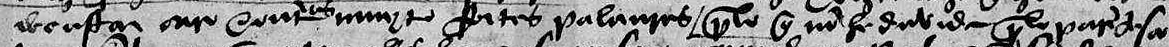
de custar caro e outras muyto fortes palauras / p̄lo q̄ nō he duvida p̄lo parētesco
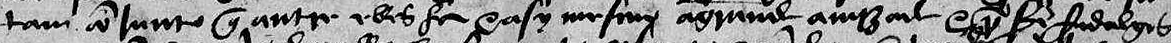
tam cōJunto q̄ antre eles ha e asy mesmo a grande amjzade e p̄o ꞩē fidalgos
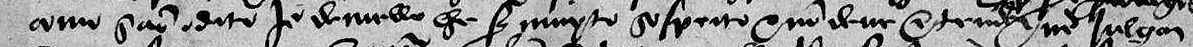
como são o dito Jo de mello lhe ꞩ muyto sospeito e nō deue ētender nē Julgar
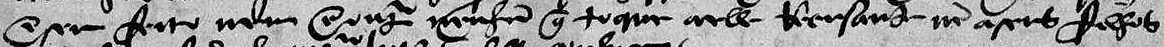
ē seu feito nem ē outro nenhū q̄ toque a elle Recusante nē a seus filhos
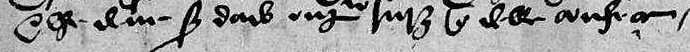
e lhe deue ꞩ dado outro Jujz q̄ delle conheça /
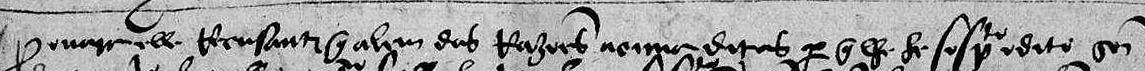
Ꝓouara elle Recusante q̄ alem das Razoẽs acima ditas ꝑ q̄ lhe he sospto o dito sor̄
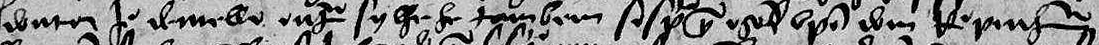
doutor Jo de mello outro sy lhe he tambem sospto p̄o o sor̄ bpō dom Ro pinhro
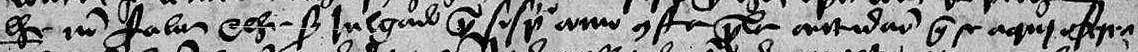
lhe nō falar e lhe ꞩ Julgado p̄o sospto como ꝯsta p̄la certidaõ q̄ se aquj oferece
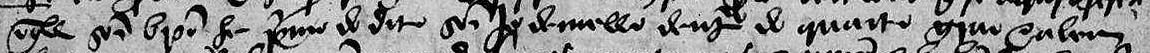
o q̄ll sor̄ bpō he pimo do dito sor̄ Jo de mello dentro do quarto grao e alem
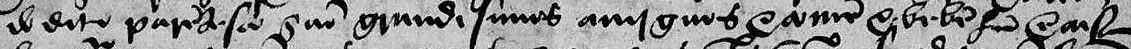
do dito parētesco saõ grandisimos amjguos e comē e bebē hū ē casa
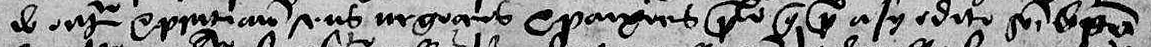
do outro e praticaõ seus negoceos e paixoes p̄lo q̄ p̄o asy o dito sor̄ bpō
